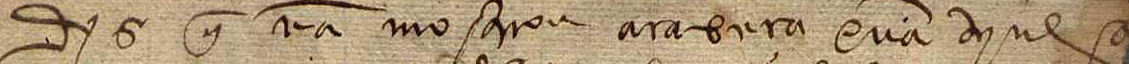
dyse q̄ n̄a mostrou a cabeça e n̄a tynha
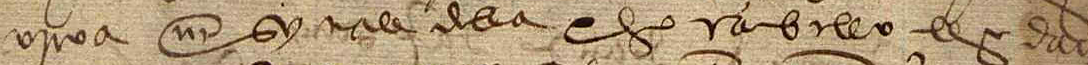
coroa nē synall della e ho cabello lhe dau
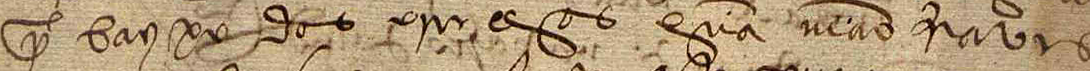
p̄o bayxo das orelhas hūa mão traves
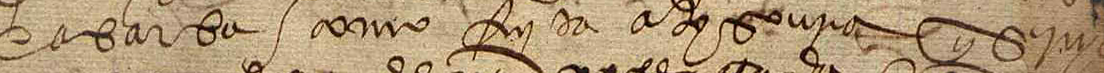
e a barba / como feyta a tysoura q̄ sery
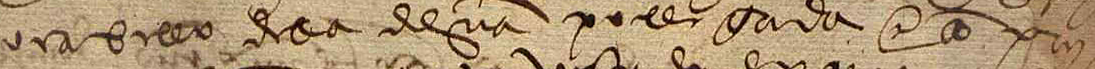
o cabello della de hūa pollegada ē c̄opry
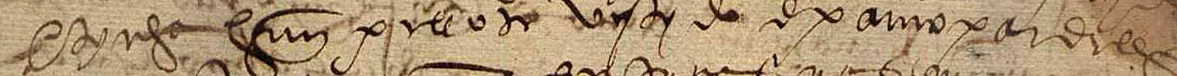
e tynha hūu pellote vistydo de panno pardilho
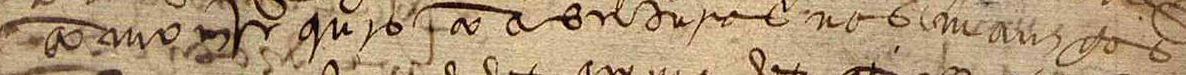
c̄omo enJequjs c̄o aberturas nas mamgas
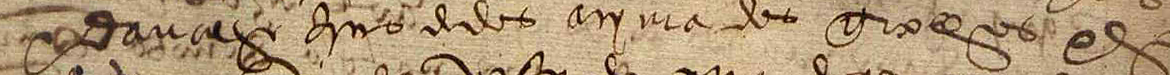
e daualhe tres dedos acyma dos giolhos e ho
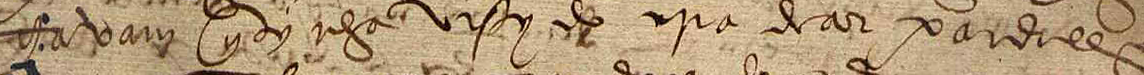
gavam q̄ tynha vistydo era de cor pardilho
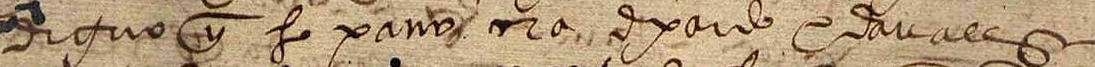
diguo q̄ ho pano era de pardo e daualhe
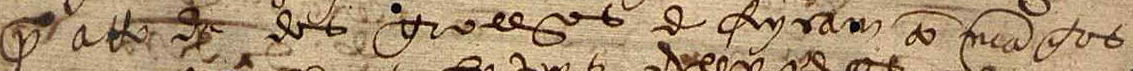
p̄o a Roda dos giolhos de feyçam c̄o māgas
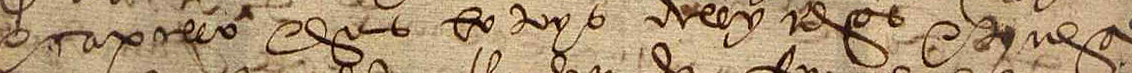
e capello e hos botoys de llynhas e tynha
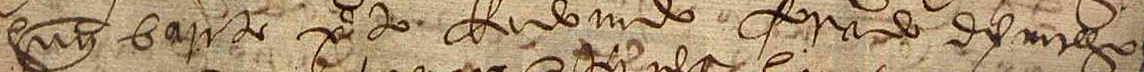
hūu barete p̄to Redomdo forado de ꝟmelho
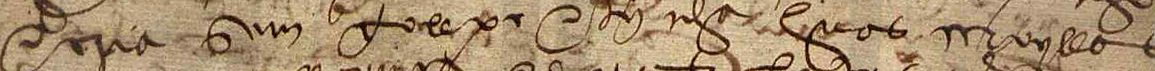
e era sem gollpe e tynha huas çeroyllas
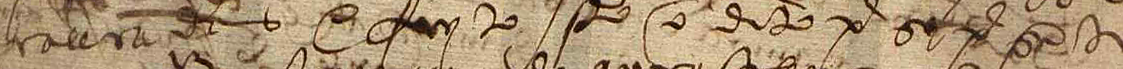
callcadas e feyto Jsto o dito p̄so p̄sēte
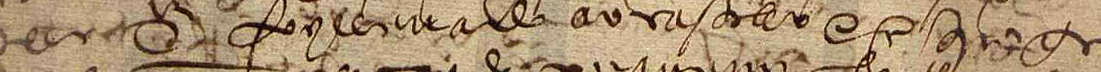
elle Cor foy lleuado ao castello e ētrege
